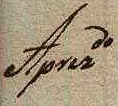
Aprez.do
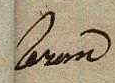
Rezam
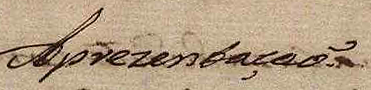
Aprezentaçaõ
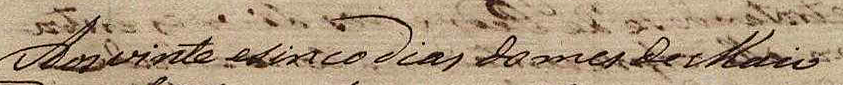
Aoz vinte e sinco dias do mes de Maio
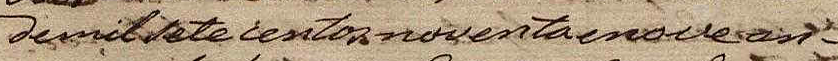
de mil setecentos noventa e nove an
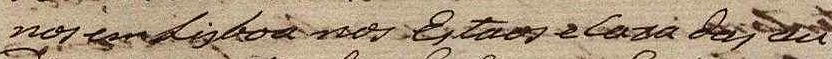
nos em Lisboa nos Estaos e Caza das au
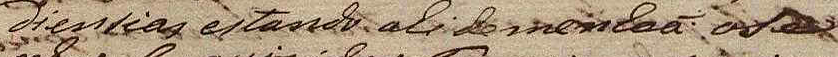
diensias estando ahi de menhaã o Se
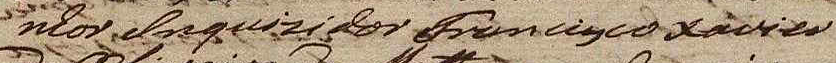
nhor Inquizidor Francisco Xavier
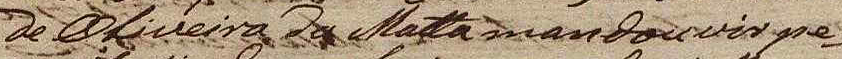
de Oliveira da Matta mandou vir pe
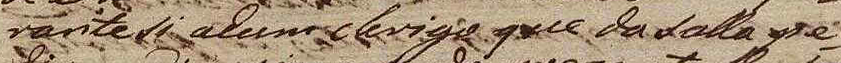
rante si a hum clerigo que da salla pe
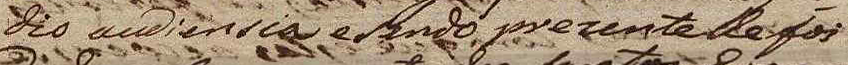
dio audiensia e sendo prezente lhe foi
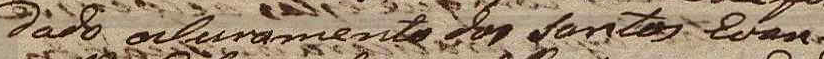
dado o Iuramento dos Santos Evan
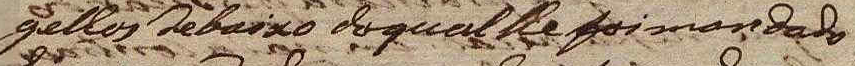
gelhos debaixo do qual lhe foi mandado
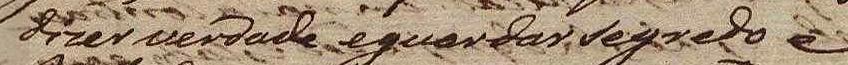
dizer verdade e guardar segredo e
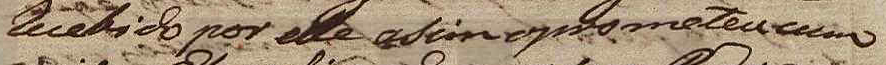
Recebido por elle asim o prometeu cum
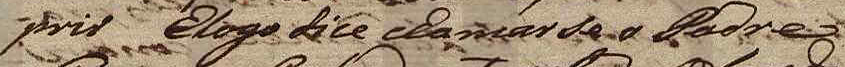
prir E logo dice chamarse o Padre
